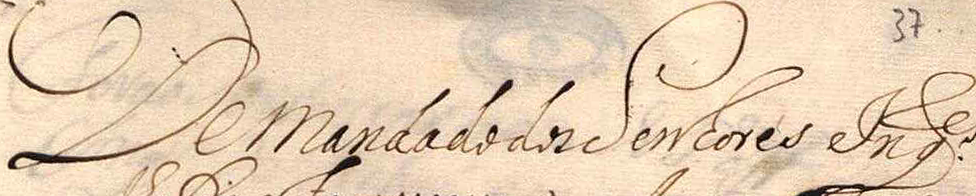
De mandado dos Senhores Inq.res
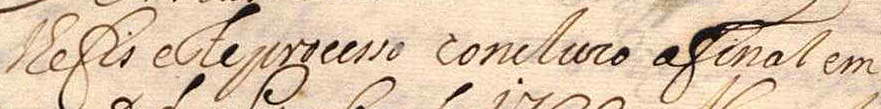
lhe fis este processo concluzo a final em
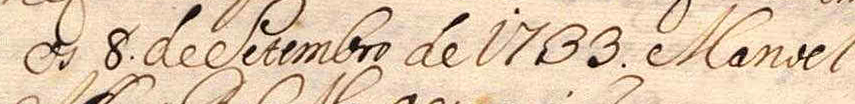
os 8. de Setembro de i733. Manoel
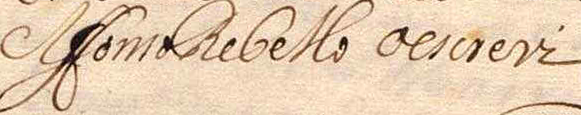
Affonso Rebello o escrevi
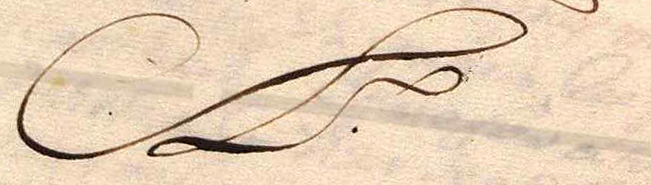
CL.o
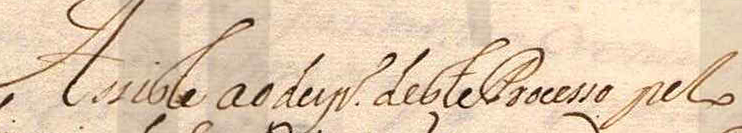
Assiste ao desp.o deste Processo pelo
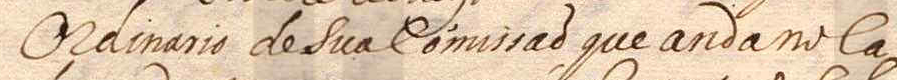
Ordinario de sua Comissaõ, que anda no Ca
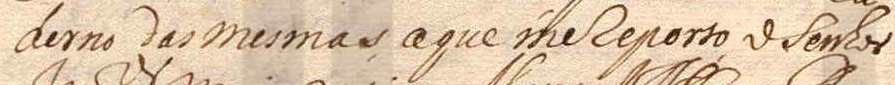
derno das mesmas, a que me Reporto, o Senhor
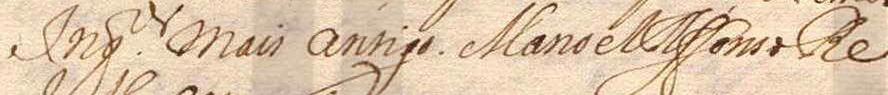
Inq.or mais antigo. Manoel Affonso Re
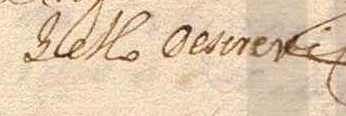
bello o escrevi
